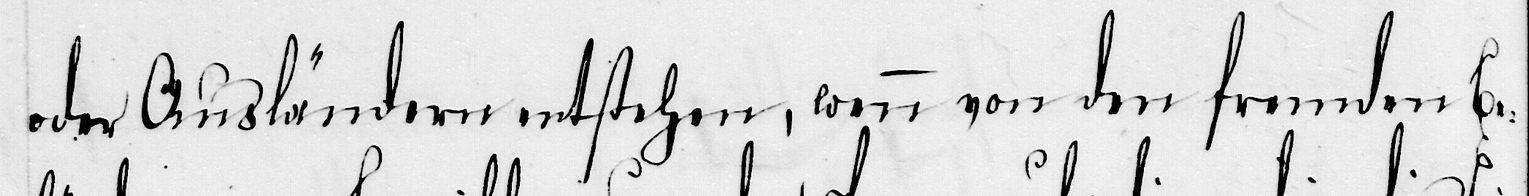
oder Ausländern entstehen, wenn von den fremden B¬
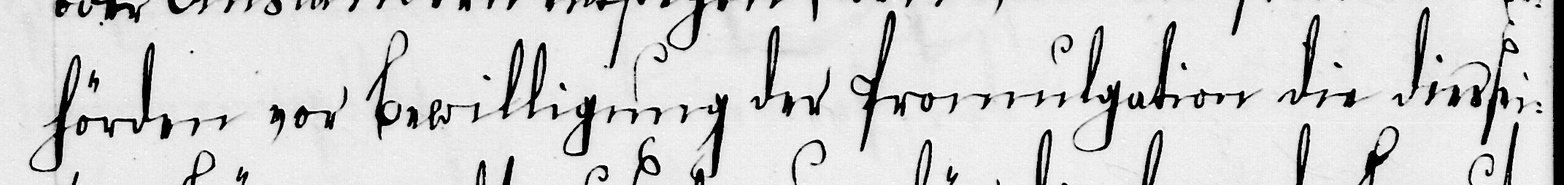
ehörden vor Bewilligung der Promulgation die diesse¬
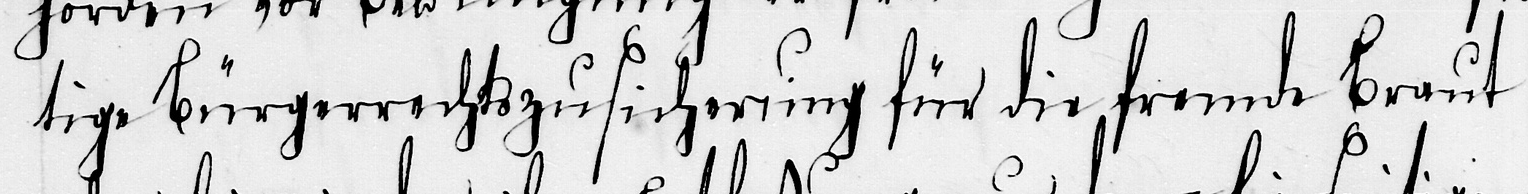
itige Bürgerrechtszusicherung für die fremde Braut
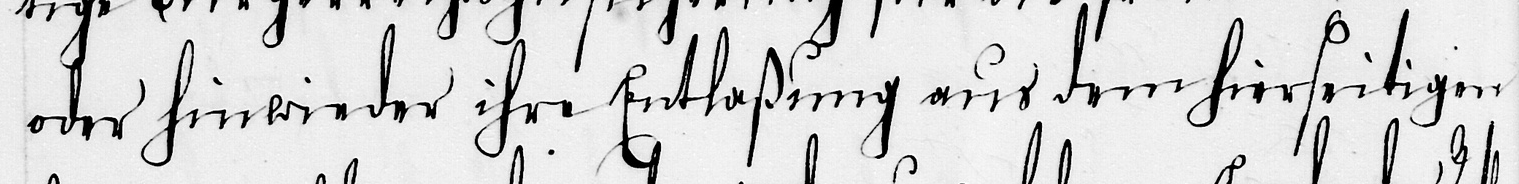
oder hinwieder ihre Entlaßung aus dem hierseitigen
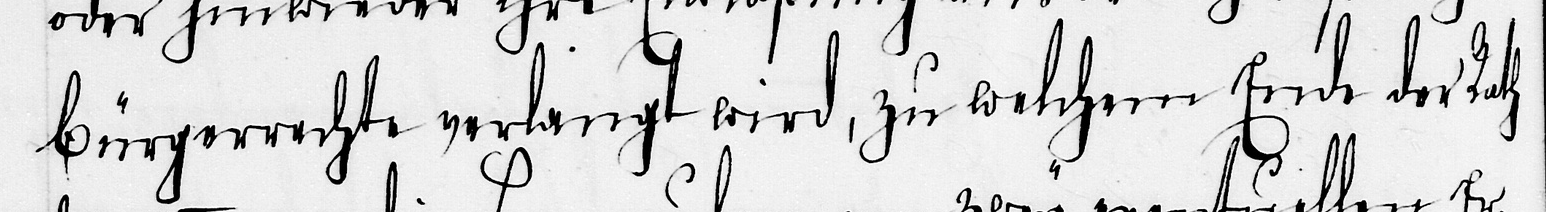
Bürgerrechte verlangt wird, zu welchem Ende der Ra¬
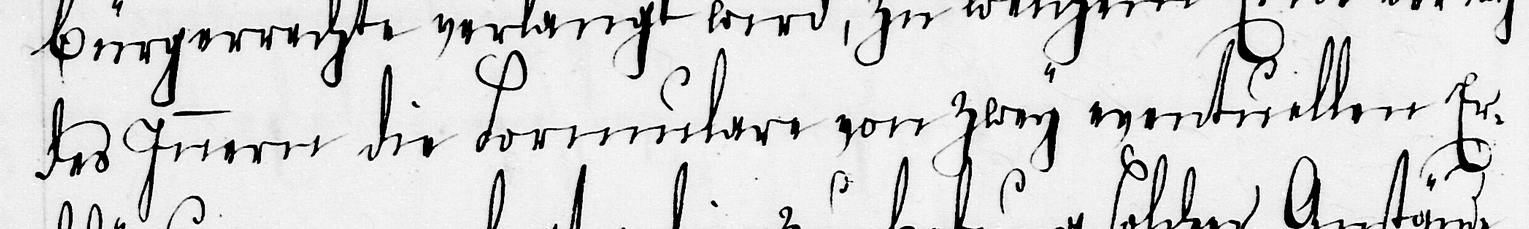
des Innern die Formulare von zwey eventuellen Er¬
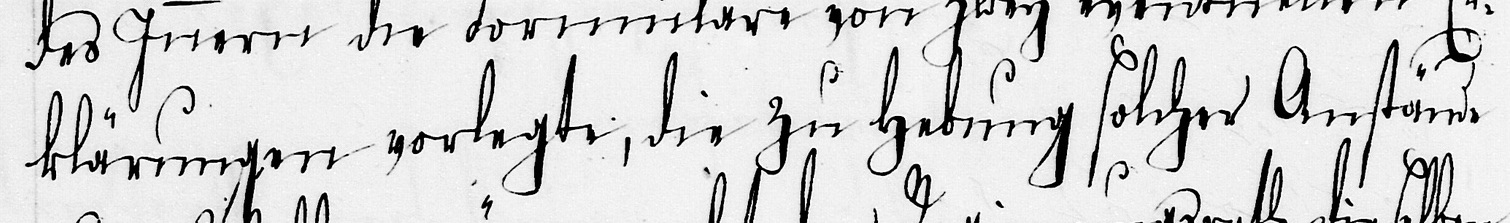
klärungen vorlegte, die zu Hebung solcher Anstände
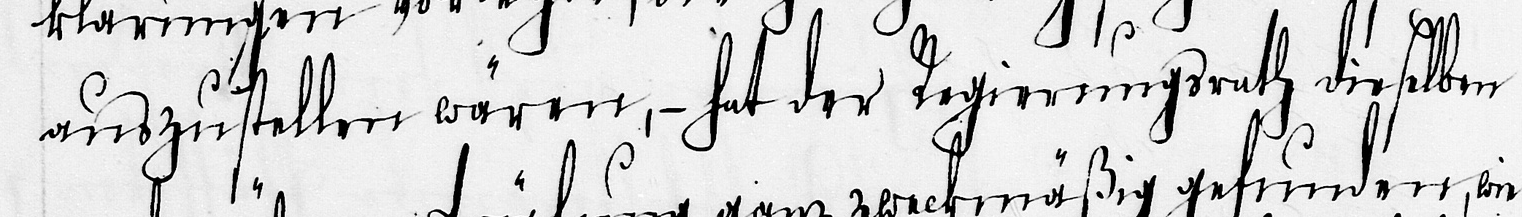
auszustellen wären, – hat der Regierungsrath dieselben
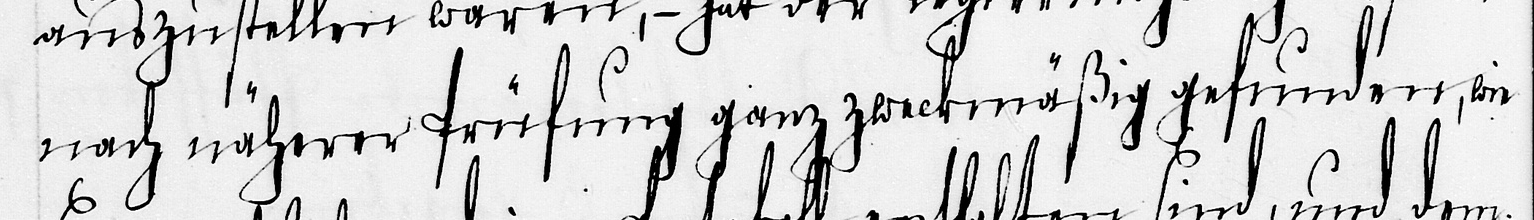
nach näherer Prüfung ganz zweckmäßig gefunden, wie
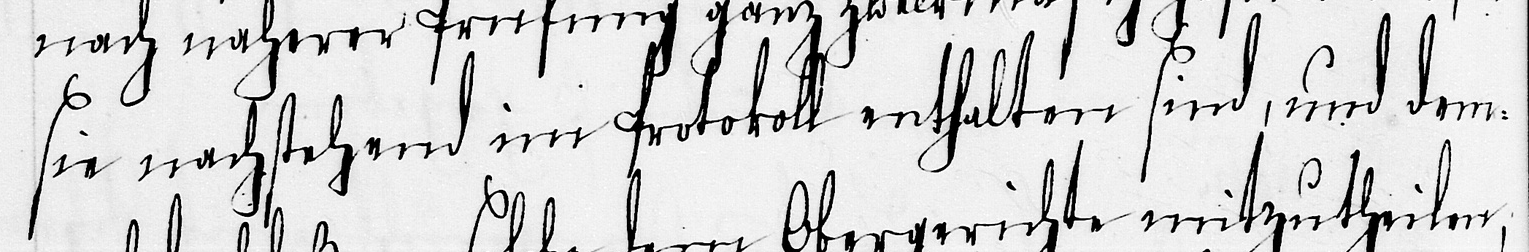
sie nachstehend im Protokoll enthalten sind, und dem¬
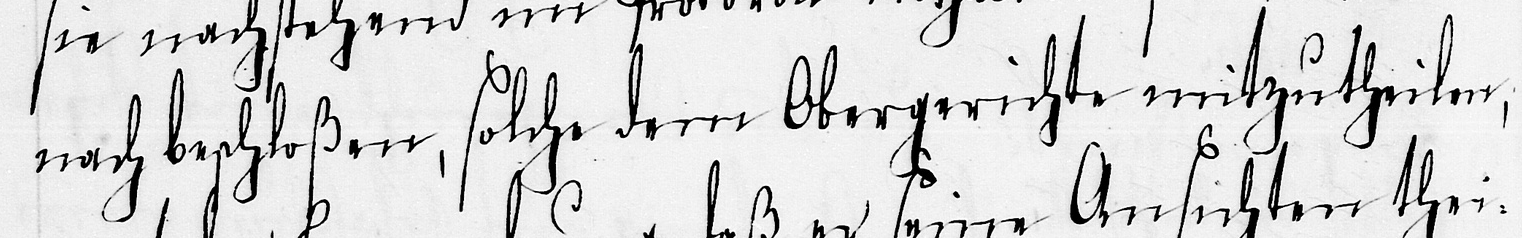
nach beschloßen, solche dem Obergerichte mitzutheilen,
